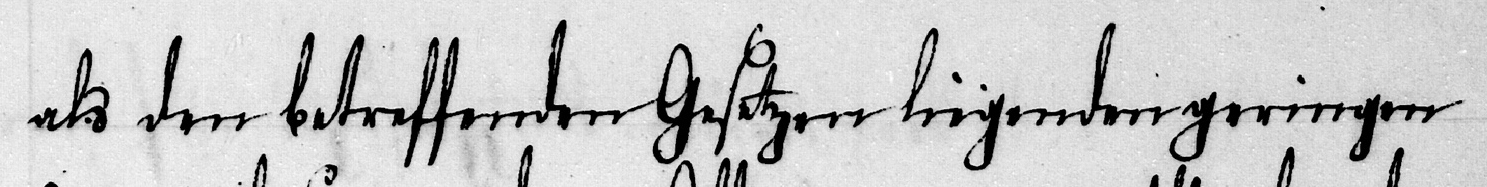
als den betreffenden Gesetzen liegenden geringen
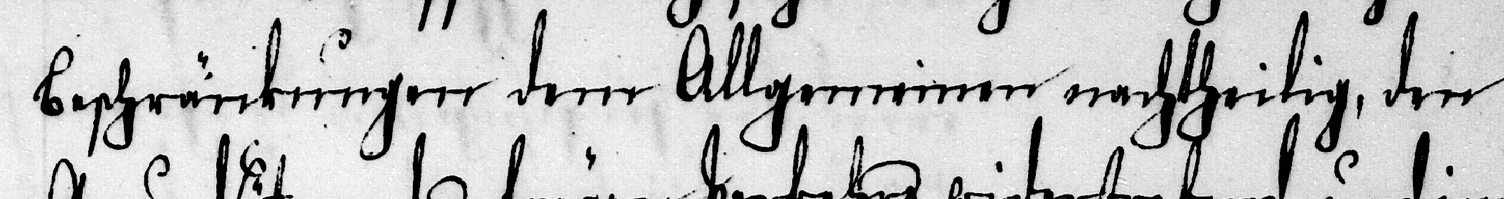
Beschränkungen dem Allgemeinen nachtheilig, den
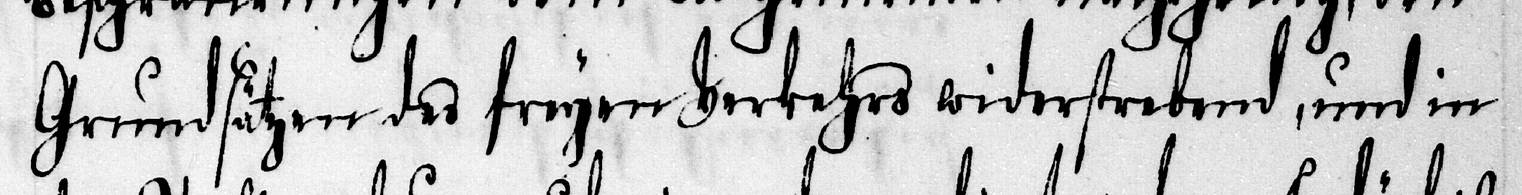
Grundsätzen des freyen Verkehrs widerstrebend, und in
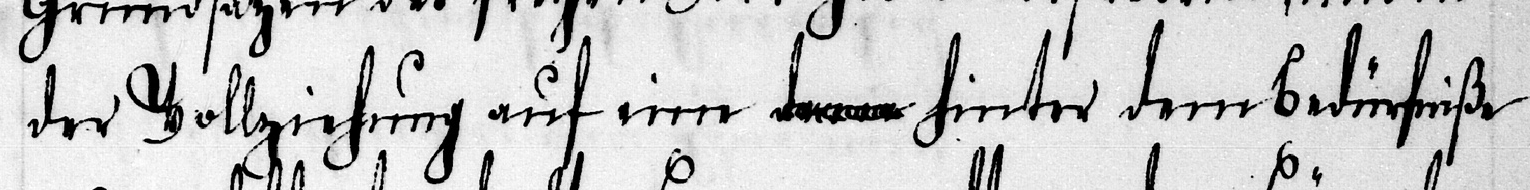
der Vollziehung auf eine hinter dem Bedürfniße
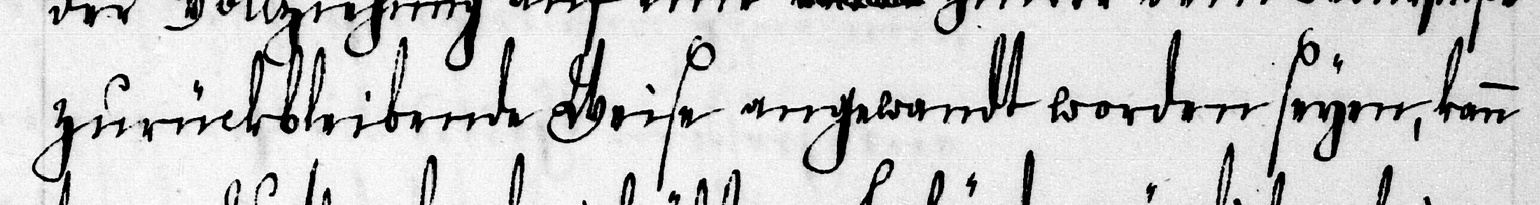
zurückbleibende Weise angewandt worden seyen, kann
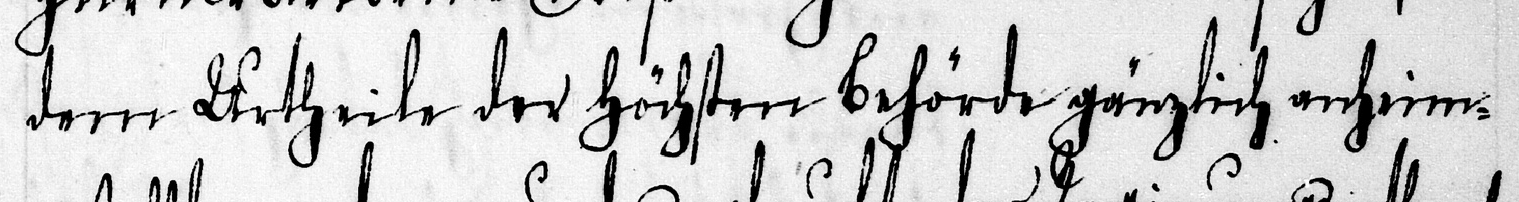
dem Urtheile der Höchsten Behörde gänzlich anheim¬
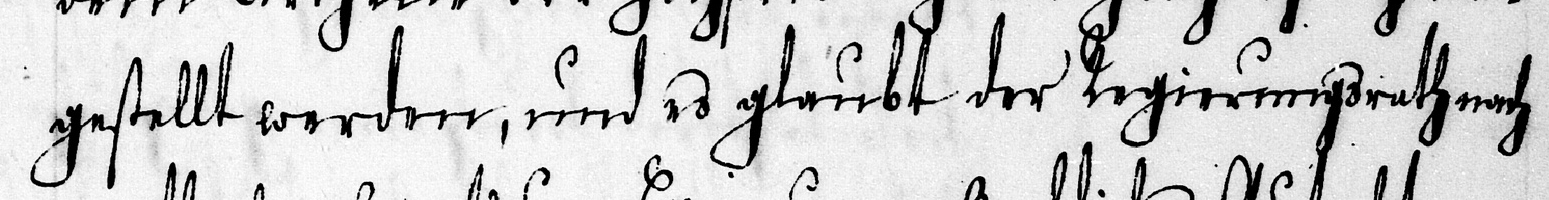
gestellt werden, und es glaubt der Regierungsrath nach
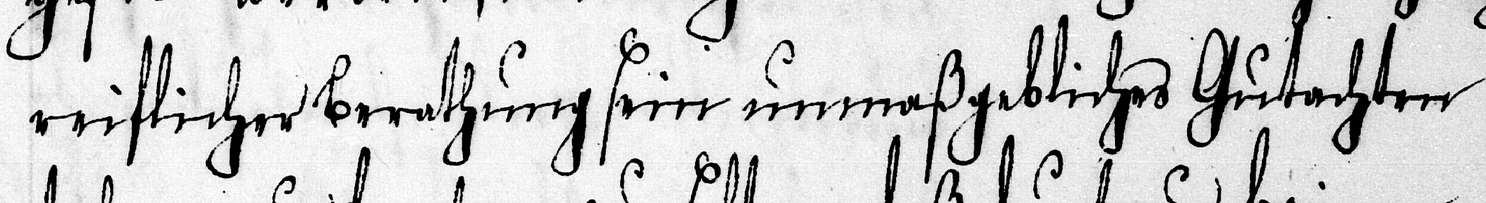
reiflicher Berathung sein unmaßgebliches Gutachten
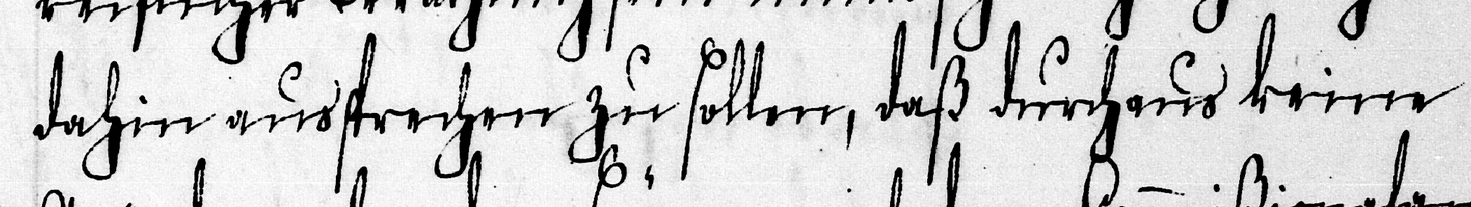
dahin aussprechen zu sollen, daß durchaus keine
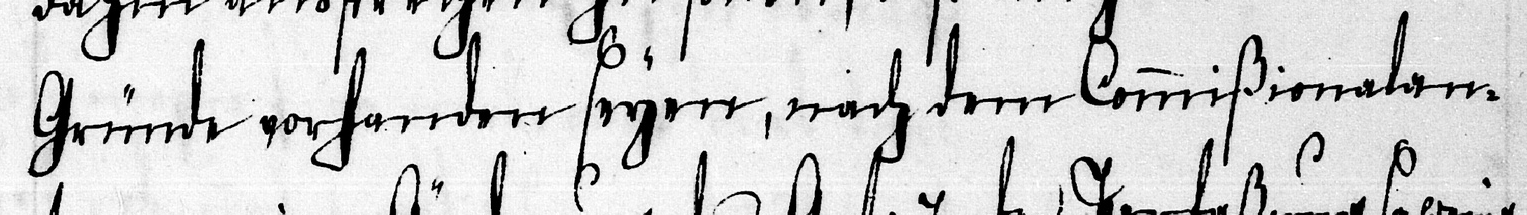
Gründe vorhanden seyen, nach dem Commißionalan¬
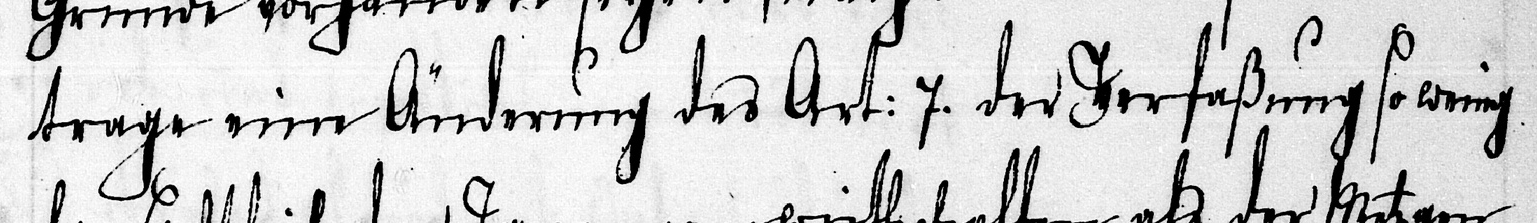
trage eine Änderung des Art: 7. der Verfaßung so wenig
